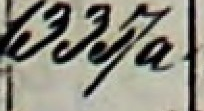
1335/a
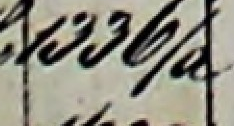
1336/a
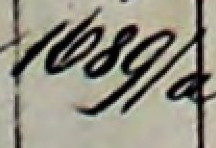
1689/a
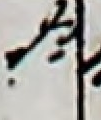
Do
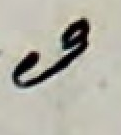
3
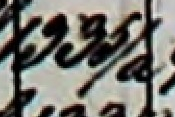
1335/a
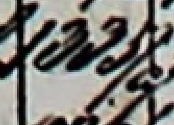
1335/c
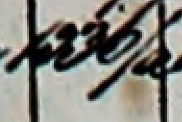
1336/a
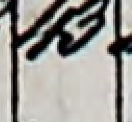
43
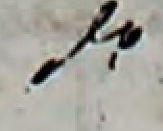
Do
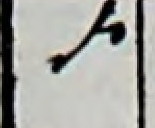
Do
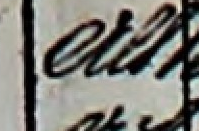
Alt
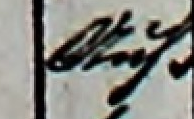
Aus
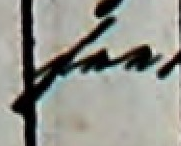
see
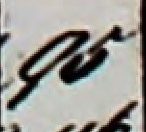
95
